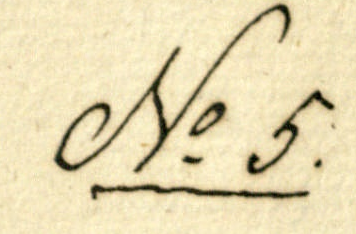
Nº 5.
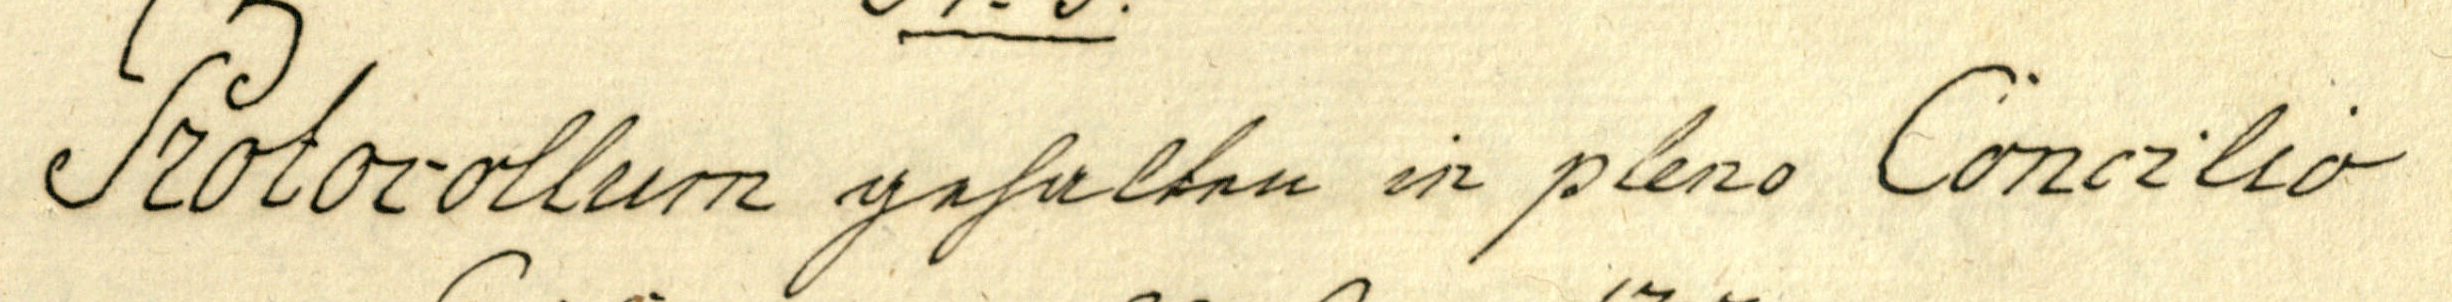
Protocollum gehalten in pleno Concilio
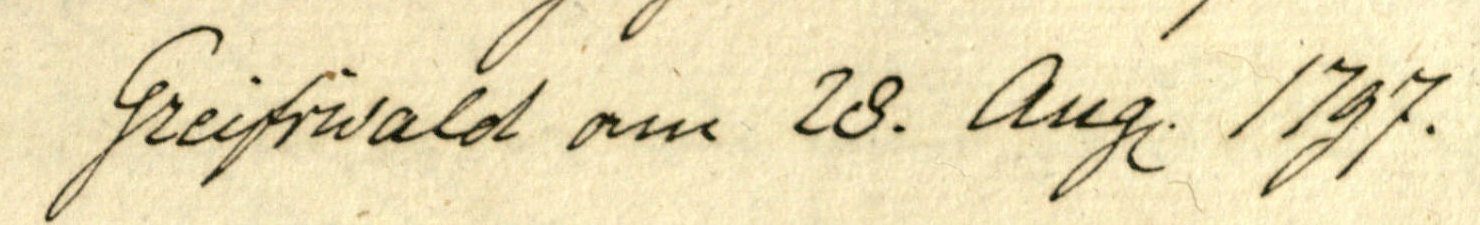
Greifswald am 28. Aug. 1797.
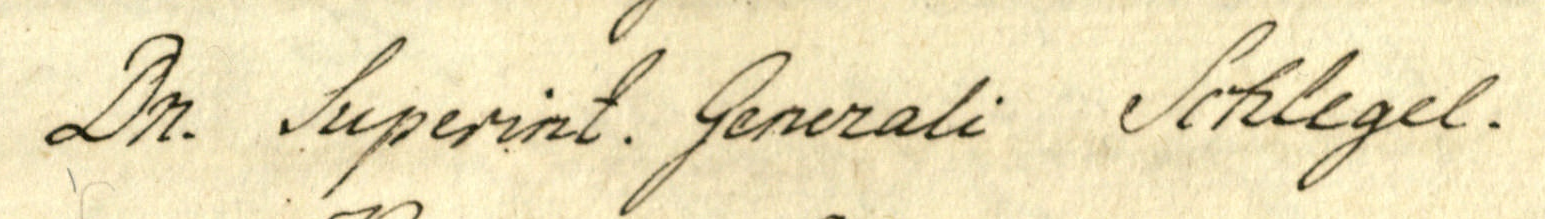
Dn. Superint. Generali Schlegel
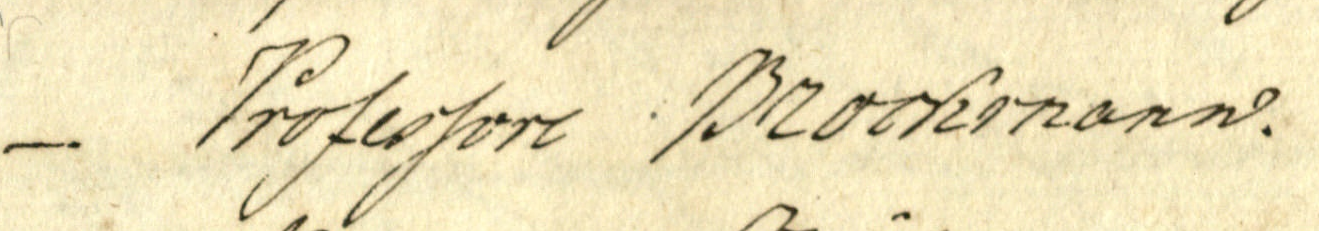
Professore Brockmann.
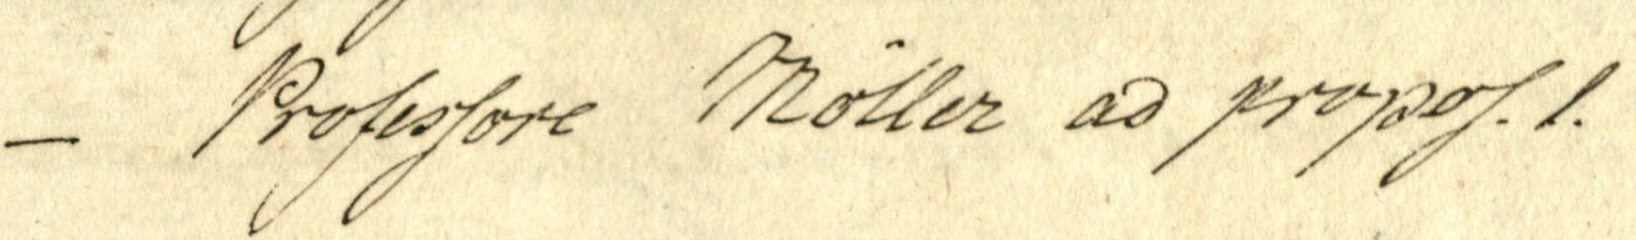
Professore Möller ad propos. 1.
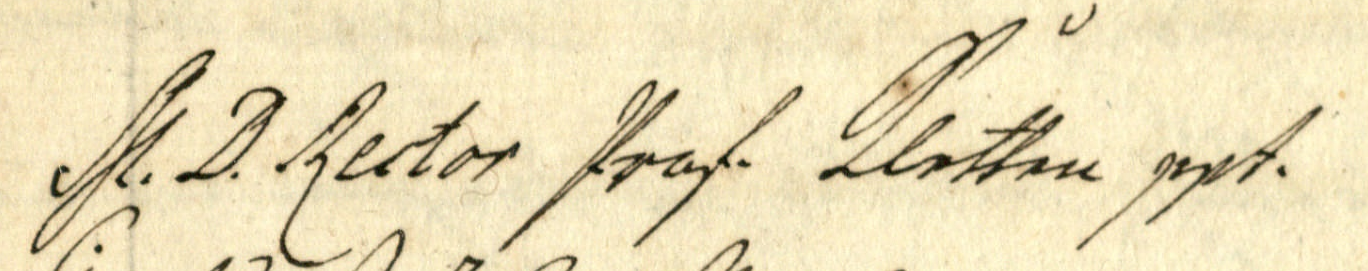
M. D. Rector Prof. Kletten ppt.
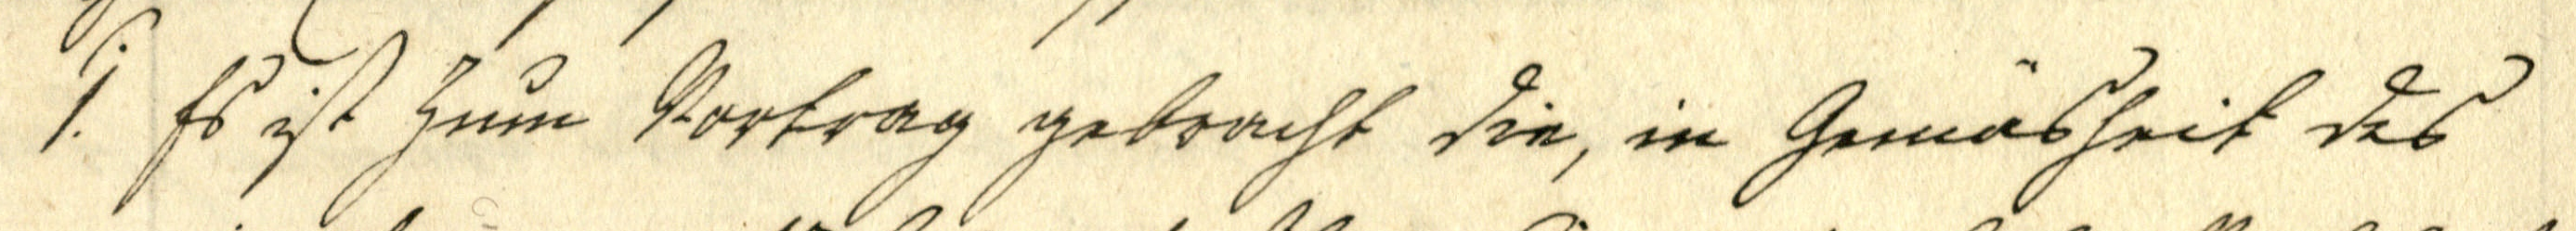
1., Es ist zum Vortrag gebracht die, in Gemäsheit des
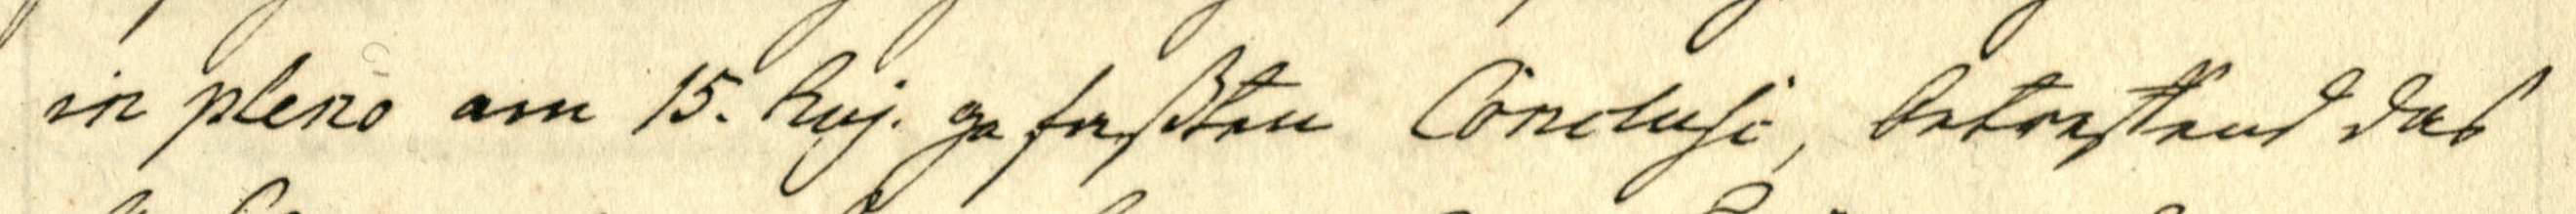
in pleno am 15. huj. gefaßten Conclusi, betreffend das
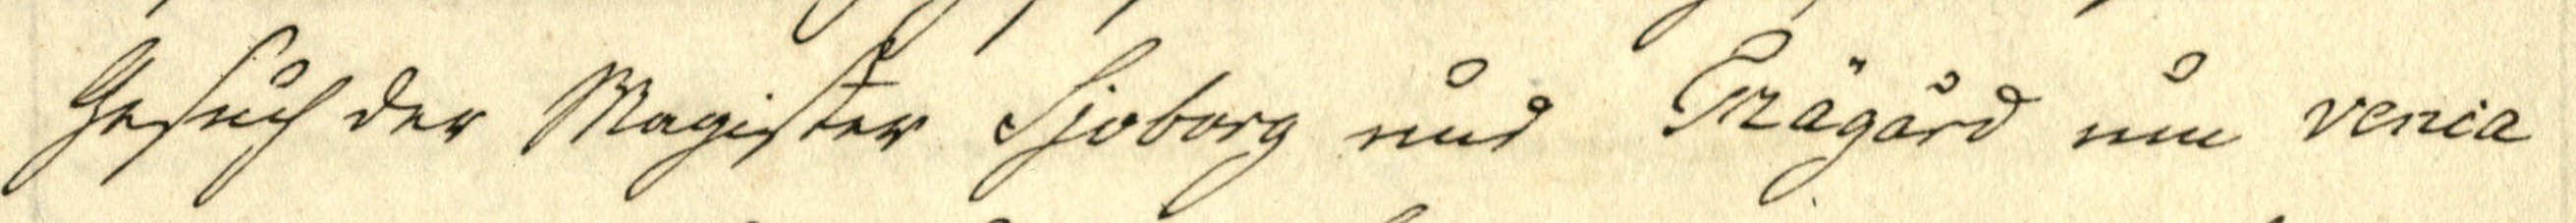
Gesuch der Magister Sjöborg und Trägård um venia
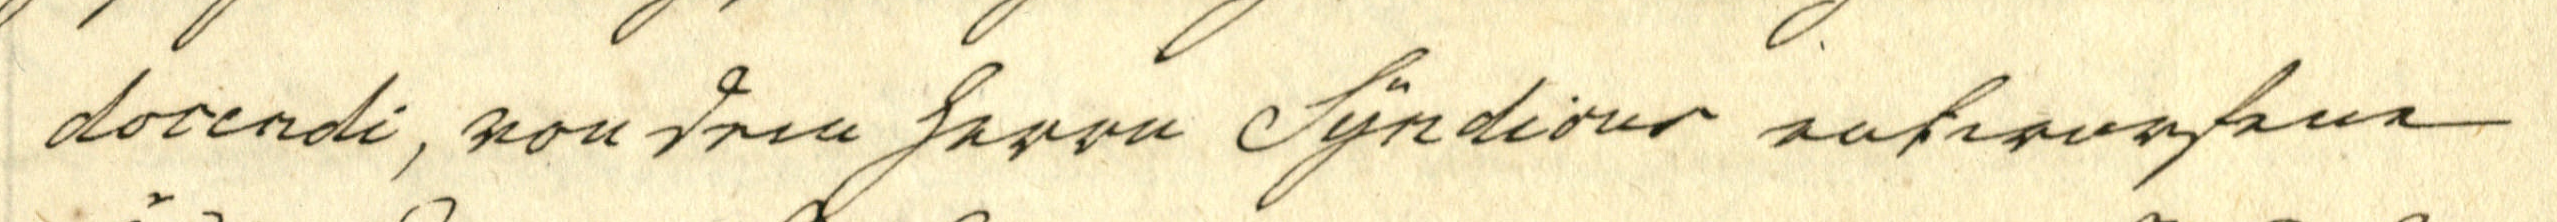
docendi, von dem herrn Sÿndicus entworfene
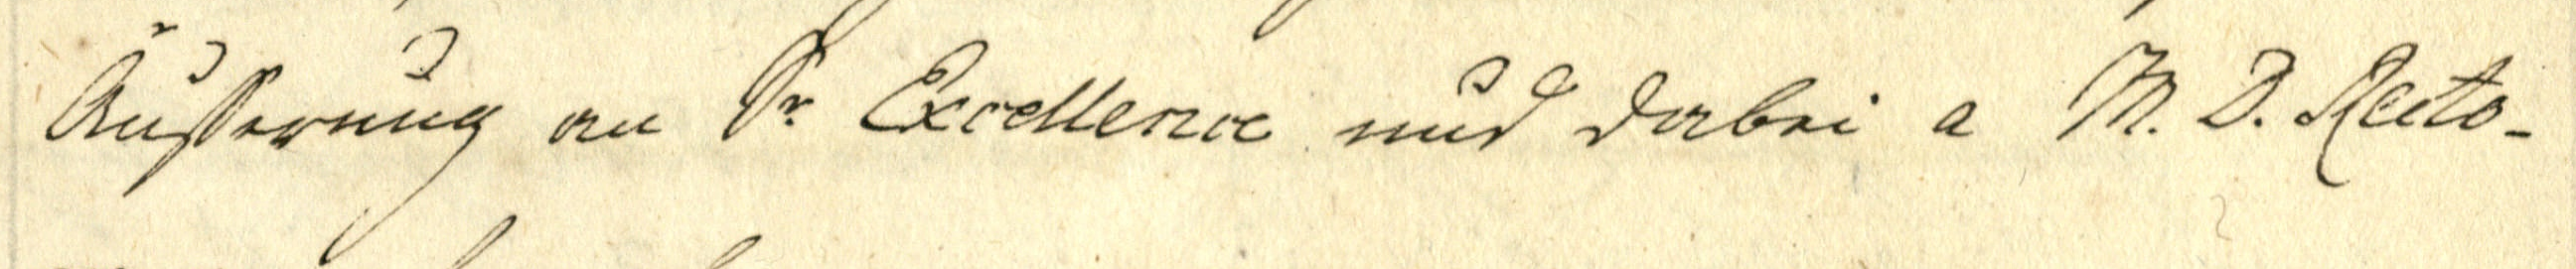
Äusserung an Sr. Excellence und dabei a M. D. Recto¬
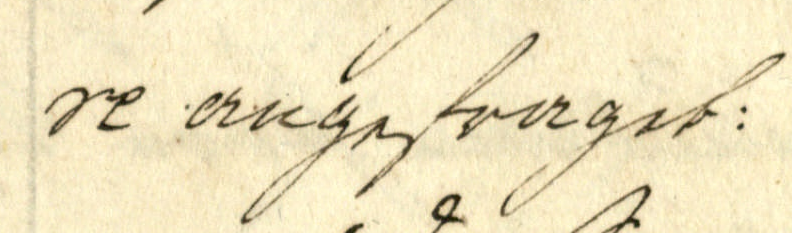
re angefraget:
